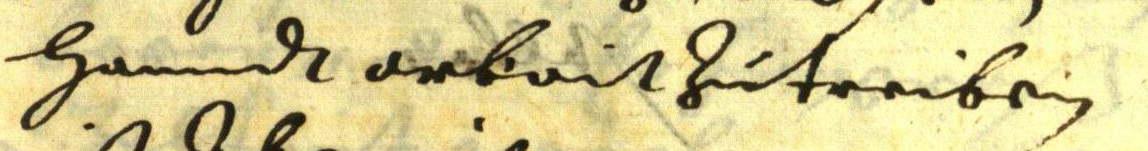Hanndt arbait Zūtreiben,
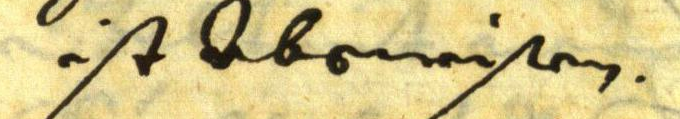ist Abgwisen.
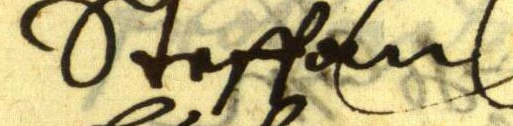Steffan
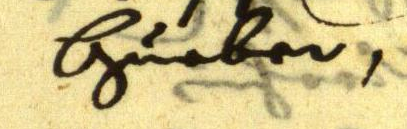Hūeber,
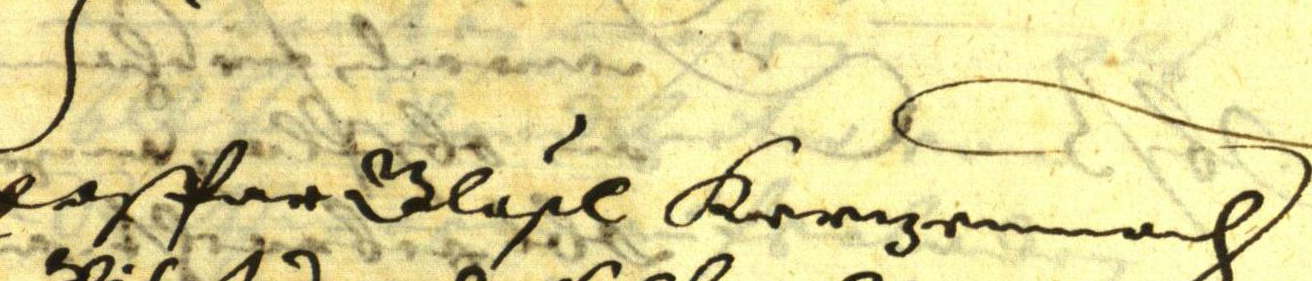Caspar Blāsl Kerzenmach
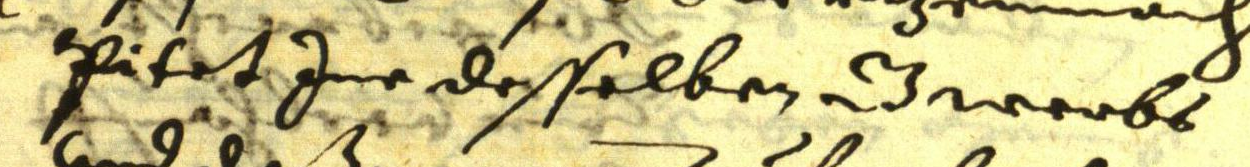Pitet Ine desselben Gwerbs
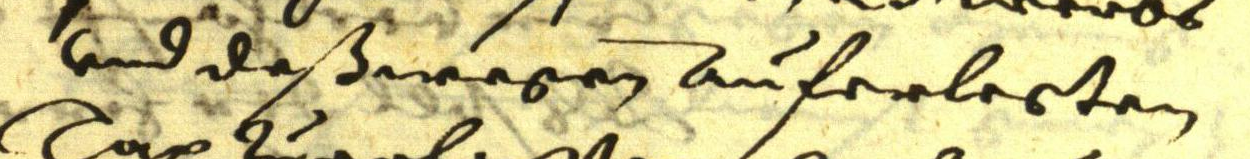vnd deßwegen Aūferlegten
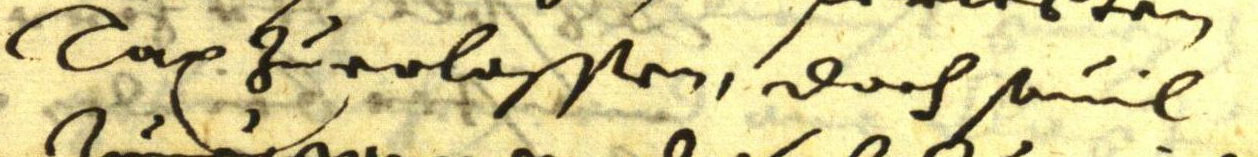Tax Zūerlassen, doch soūil
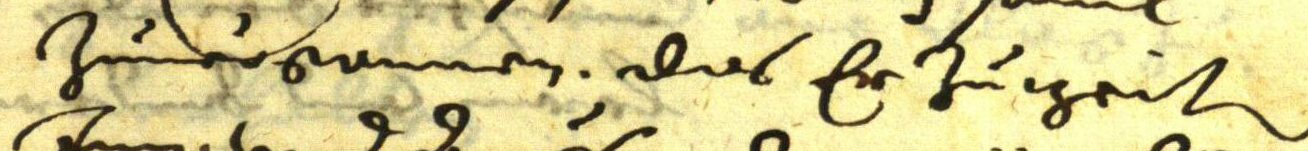Zūūergonnen. das Er Zū zeit
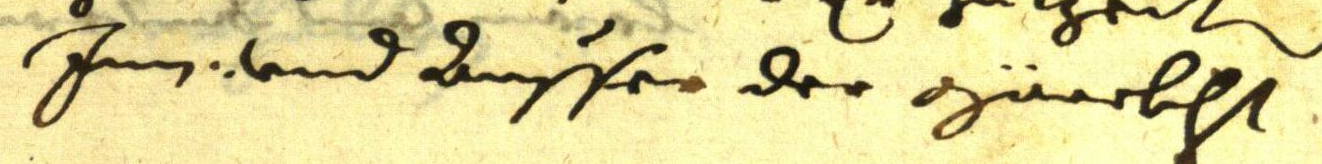Inn: vnd Aūsser der Märckht
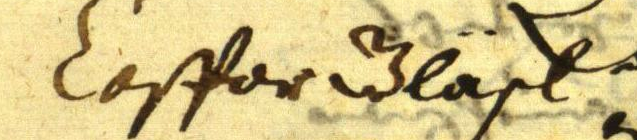Caspar Bläsl
